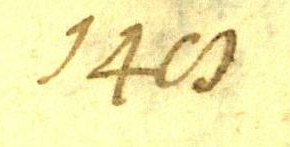148
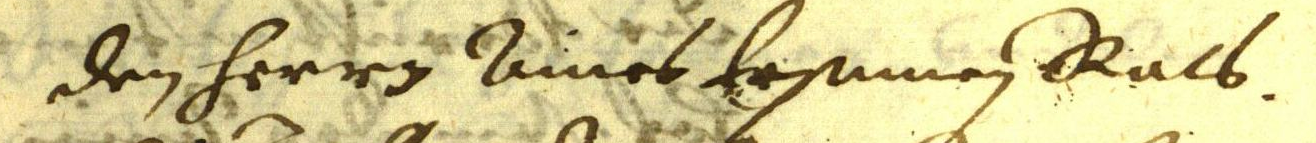den herrn Aines Ersamen Rats.
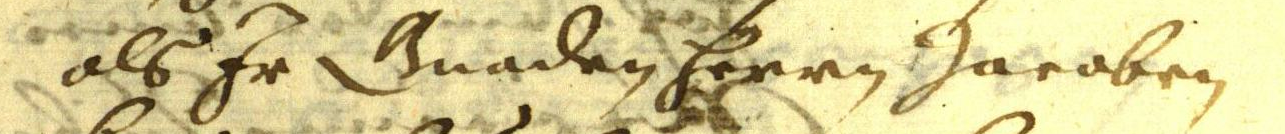als Ir Gnaden herrn Jacoben
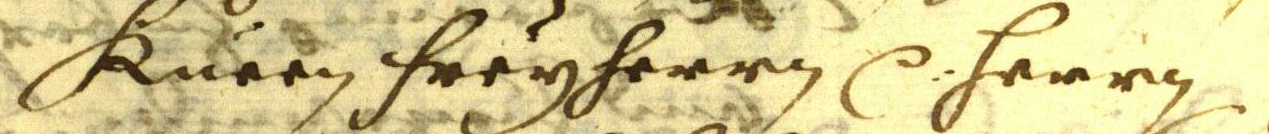Kūeen freȳherrn etc. herrn
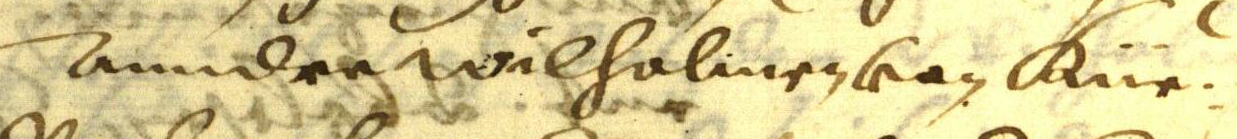Anndre Wilhalmen von Küe¬
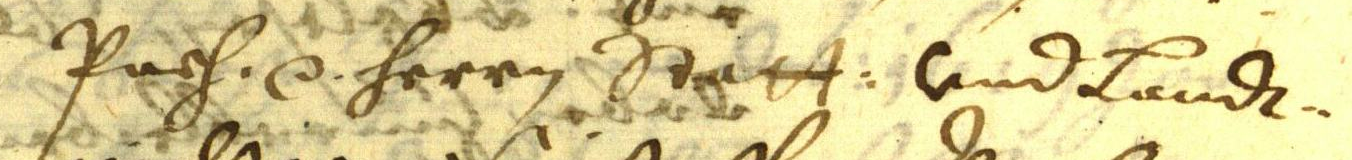Pach. etc. herrn Statt: vnd Landt¬
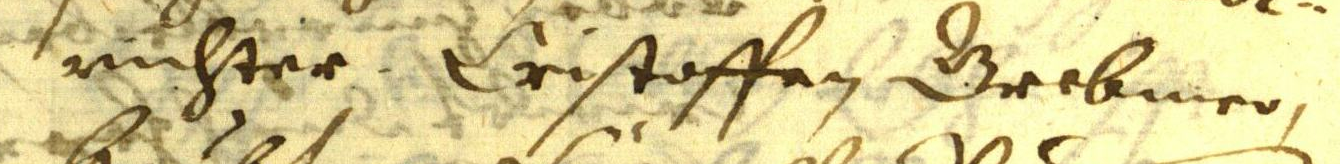richter Cristoffen Grebmer,
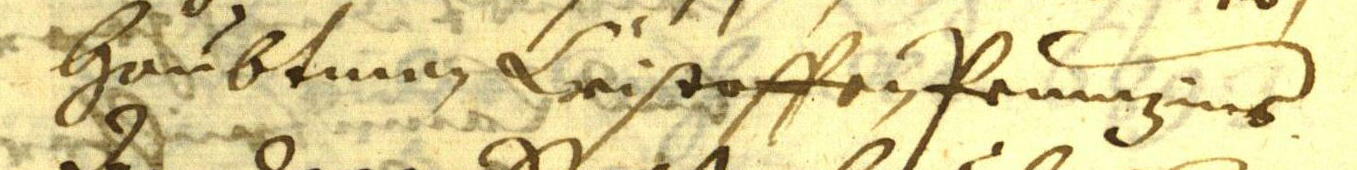Haūbtman Cristoffen Pennzing
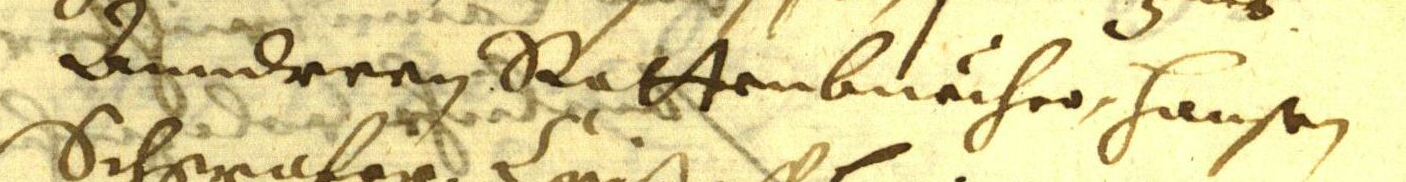Anndreen Rottenbūecher, hansen
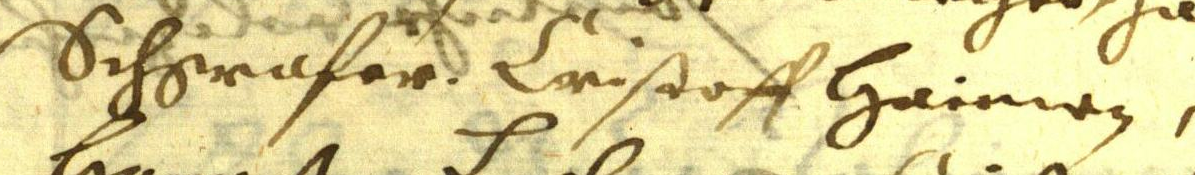Schgrafer. Cristoff Haimen,
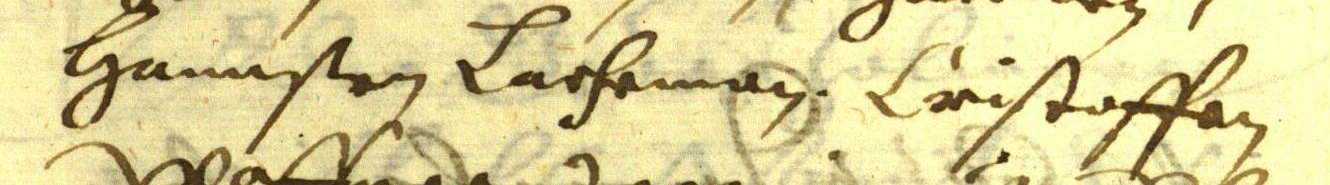Hannsen Locheman. Cristoffen
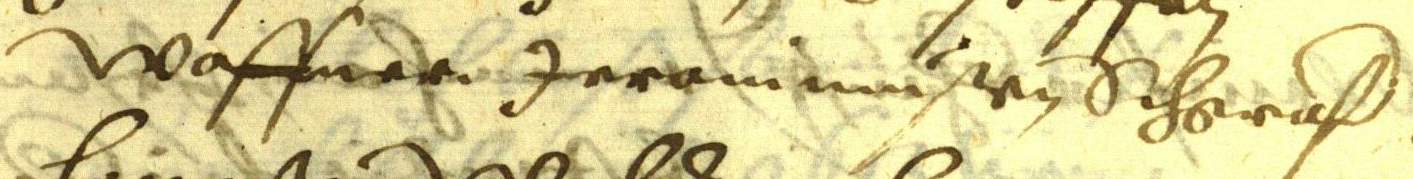Waffner. Jeronimūsen Schgraf.
